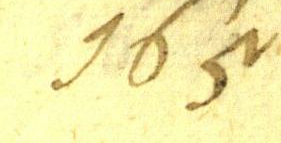165
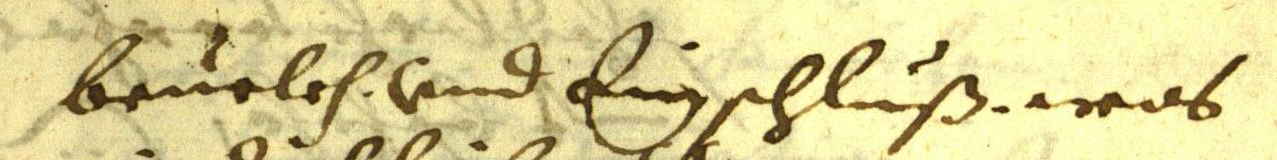beūelch. vnd Einschlūß. was
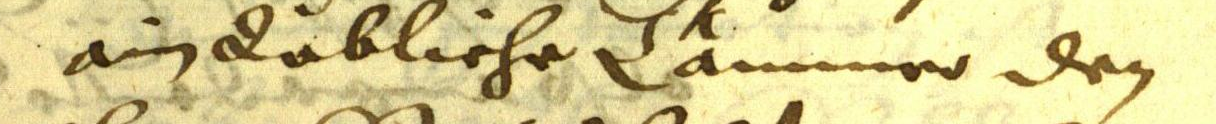ain Lobliche Cammer den
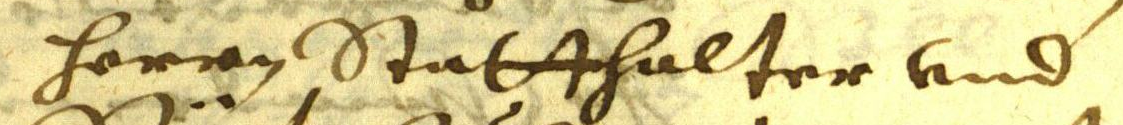herrn Statthalter vnd
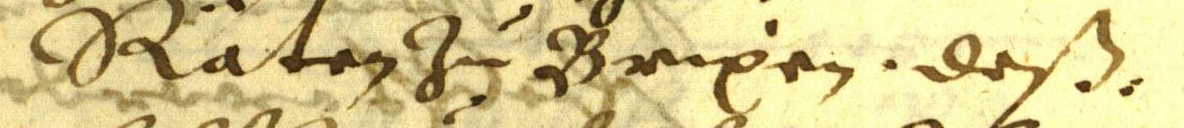Räten Zū Brixen. deß¬
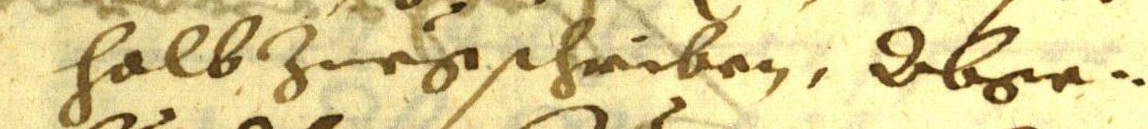halb Zūegschriben, Abge¬
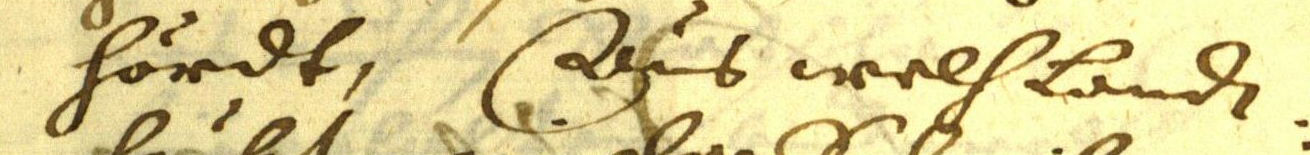hōrdt, Aūs welh Landt¬
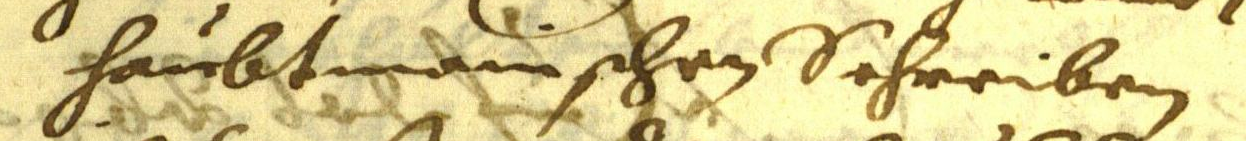haūbtmanischen Schreiben
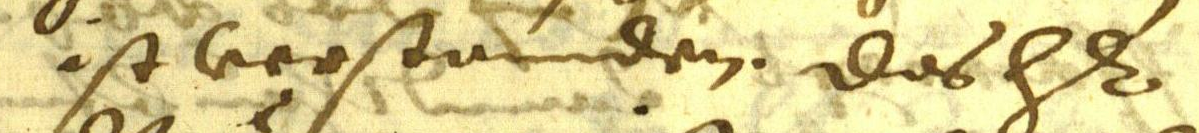ist verstannden. das h.
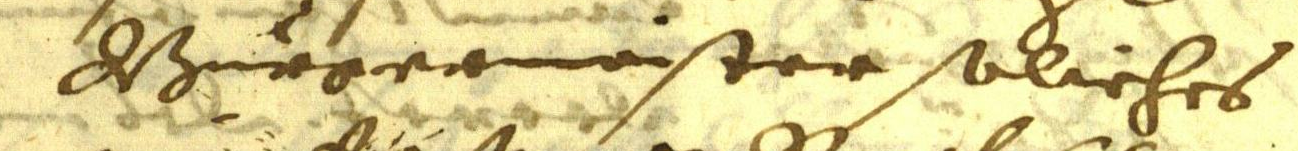Būrgermaister soliches
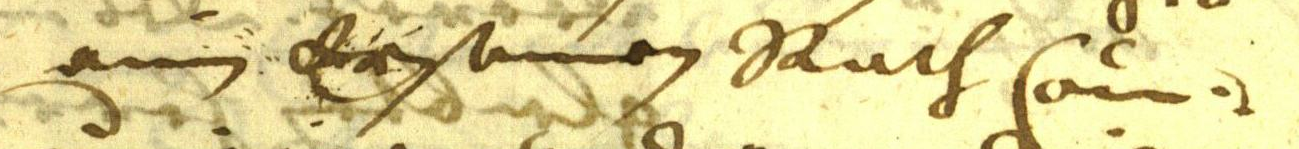aim Ersamen Rath Com¬
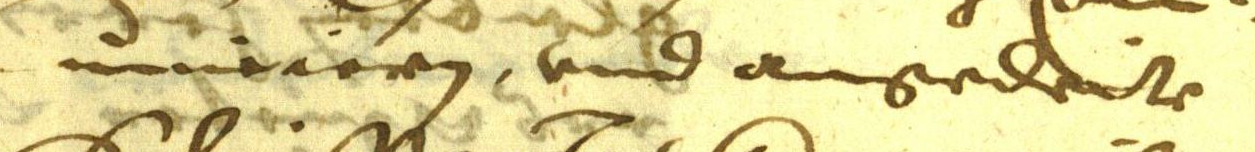ūniciern, vnd angedeite
